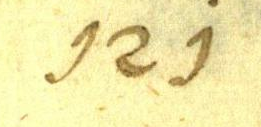121
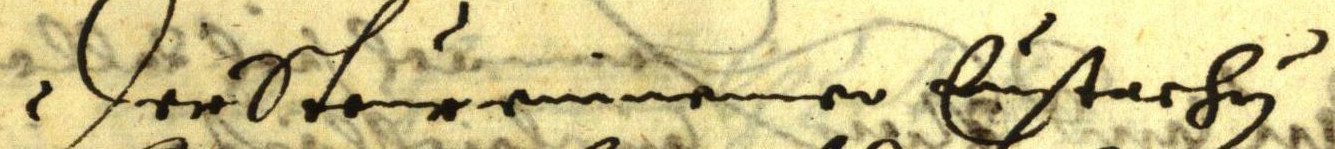Der Steūreinnemer Eūstachȳ
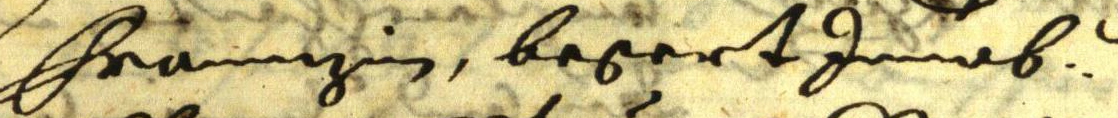Frannzin, begert Innab¬
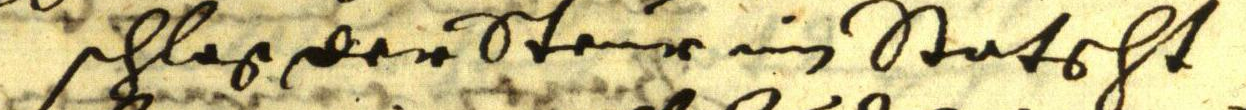schlag der Steūr im Statght
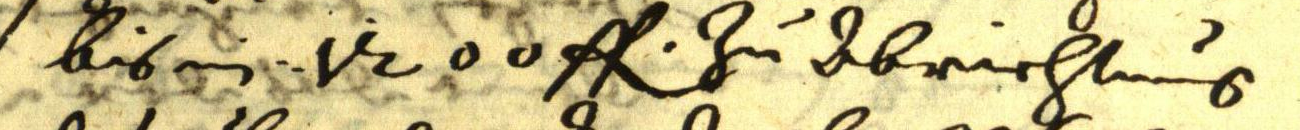bis in: 1200 fl. Zū Abrichtūng
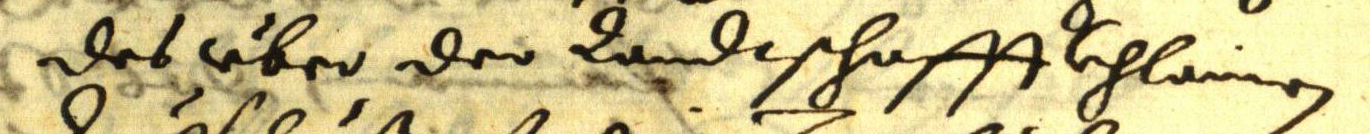des v̄ber der Landtschafft khlainen
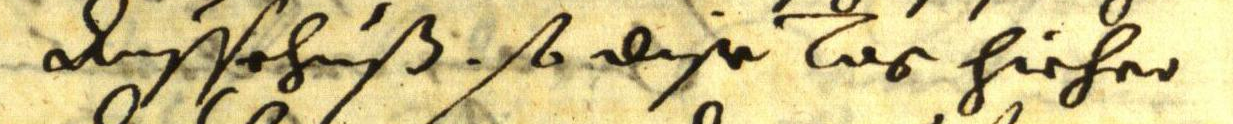Aūsschūß. so dise Tag hieher
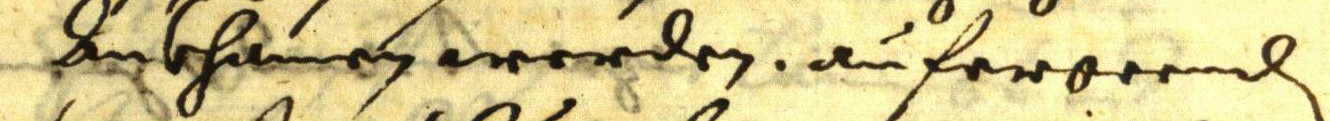Ankhomen werden. aūfergeend
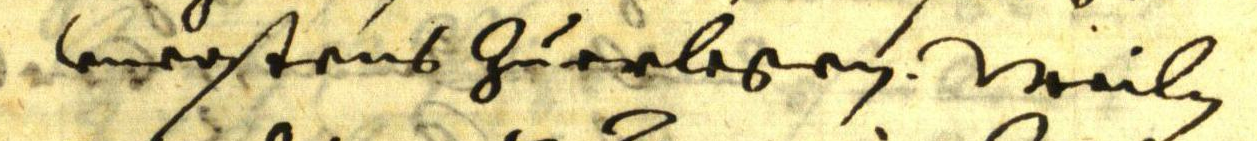vncostens Zū erlegen. Weiln
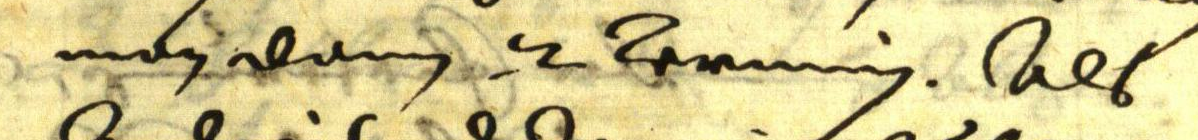man dann .2 Termin. Als
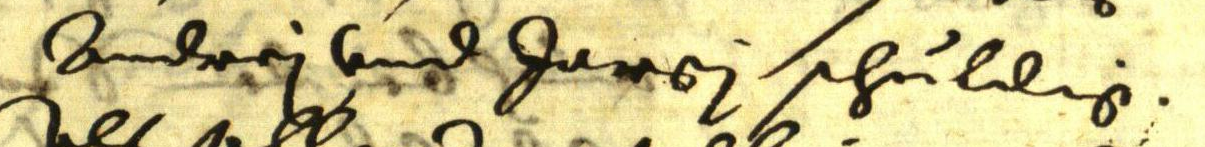Andrej vnd Jorgj schūldig.
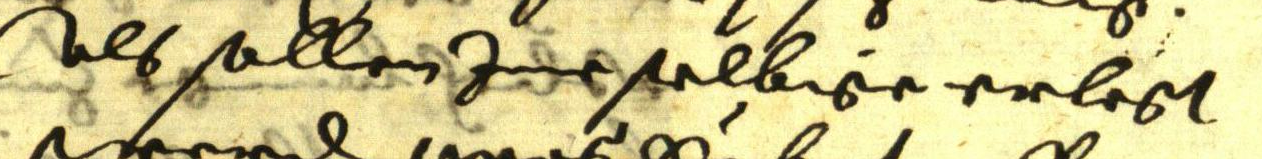Als sollen Ime selbige erlegt
